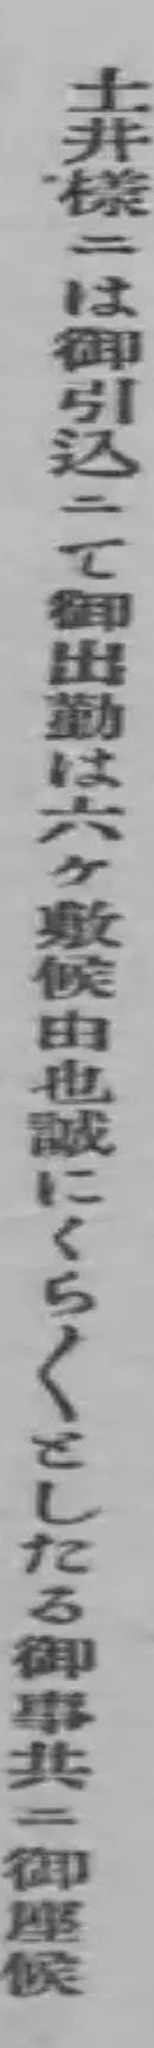土井様ニは御引込ニて御出勤は六ケ敷候由也誠にくら〳〵としたる御事共ニ御座候
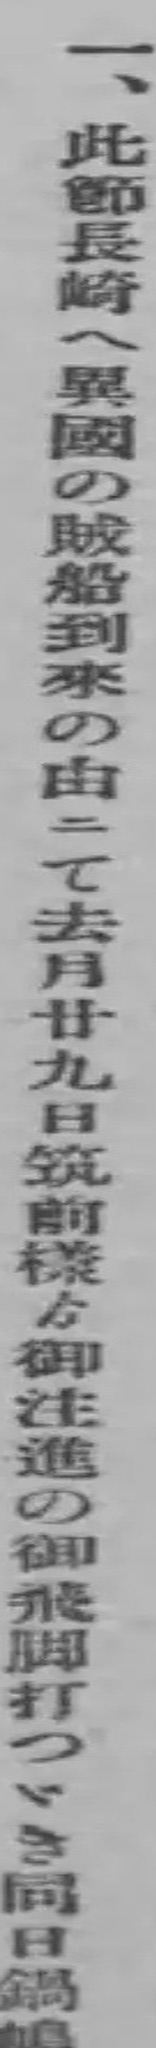一、此節長崎へ異国の賊船到来の由ニて去月廿九日筑前様ゟ御注進の御飛脚打つゞき同日鍋嶋
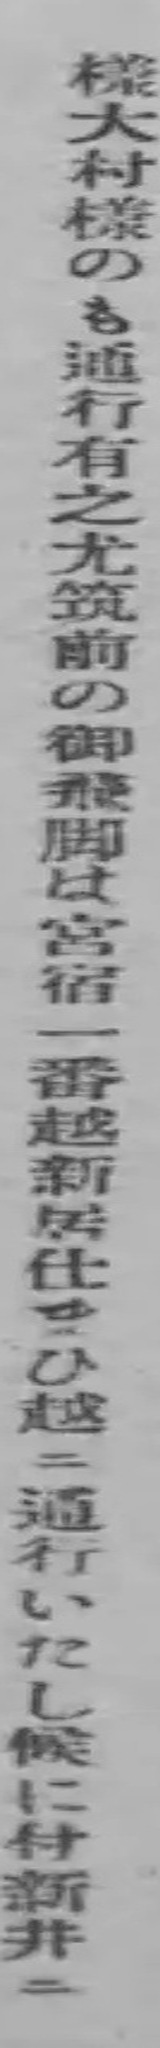様大村様のも通行有之尤筑前の御飛脚は宮宿一番越新居仕まひ越ニ通行いたし候に付新井ニ
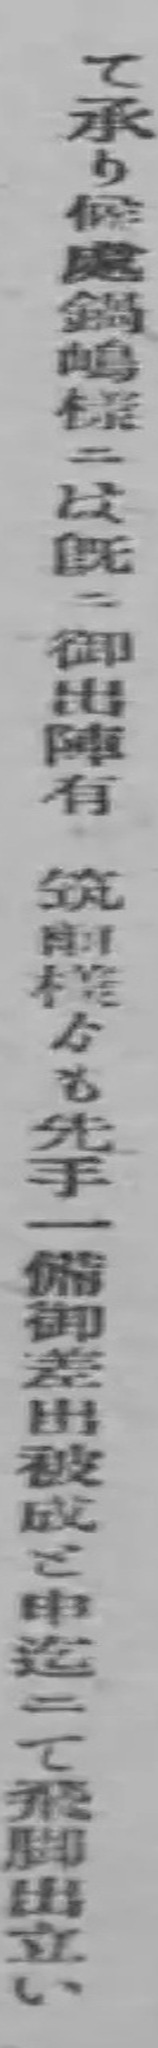て承り候処鍋嶋様ニは既ニ御出陣有筑前様ゟも先手一備御差出被成と申迄ニて飛脚出立い
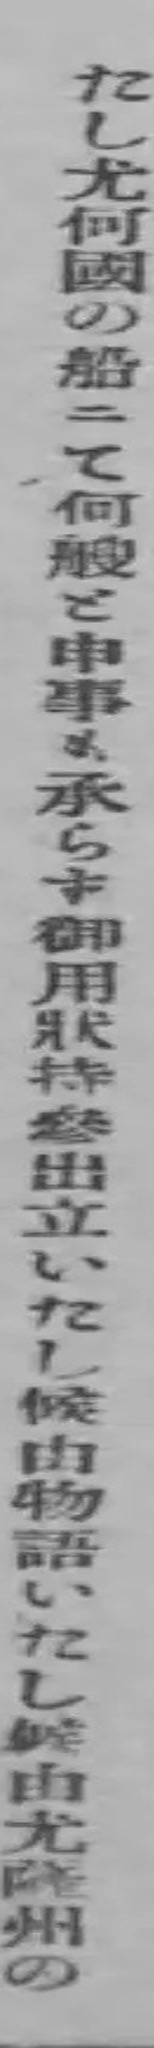たし尤何国の船ニて何艘と申事も承らず御用状持参出立いたし候由物語いたし候由尤薩州の
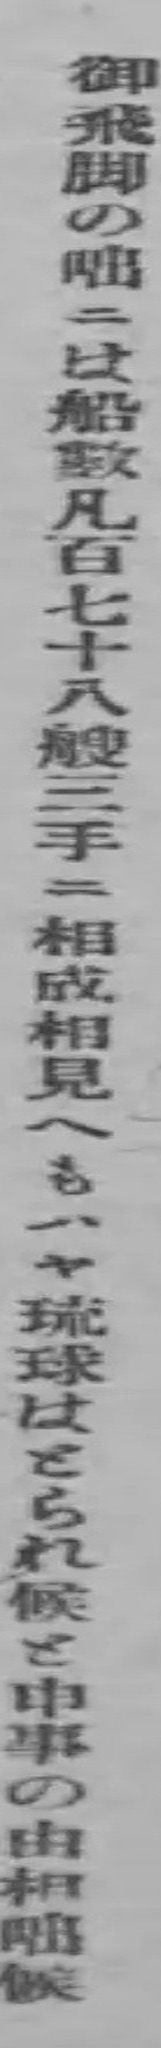御飛脚の咄ニは船数凡百七十八艘三手ニ相成相見へもハヤ琉球はとられ候と申事の由相咄候
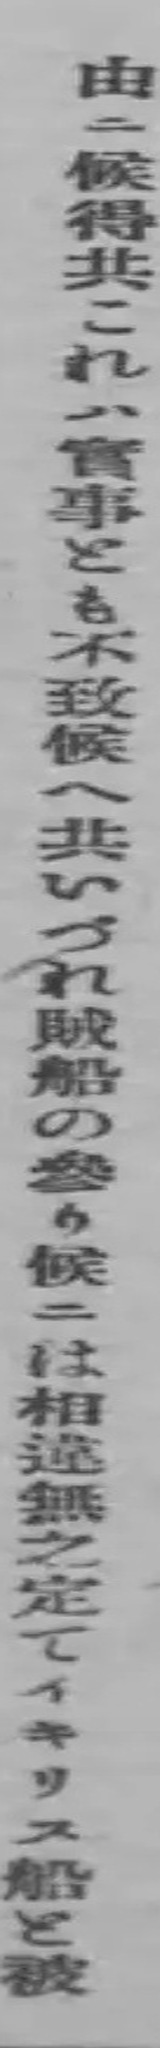由ニ候得共これハ実事とも不致候へ共いづれ賊船の参り候ニは相違無之定てイキリス船と被
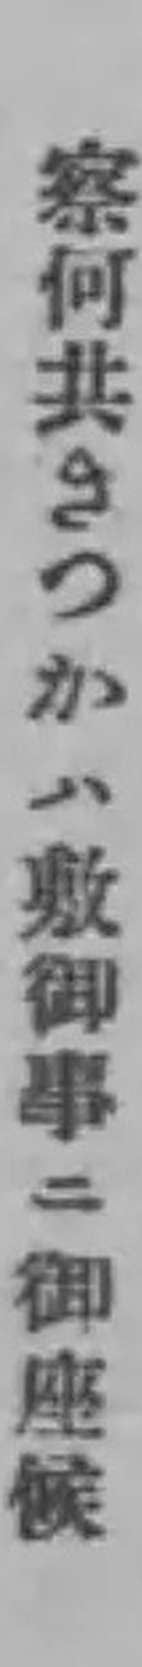察何共きつかハ敷御事ニ御座候
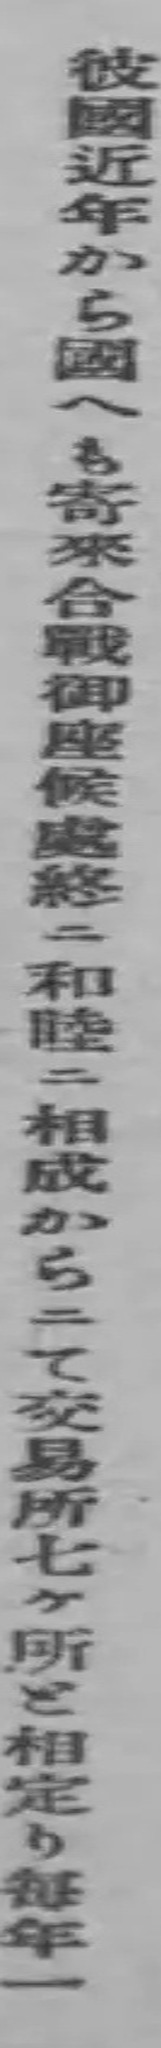彼国近年から国へも寄来合戦御座候処終ニ和睦ニ相成からニて交易所七ケ所と相定り毎年一
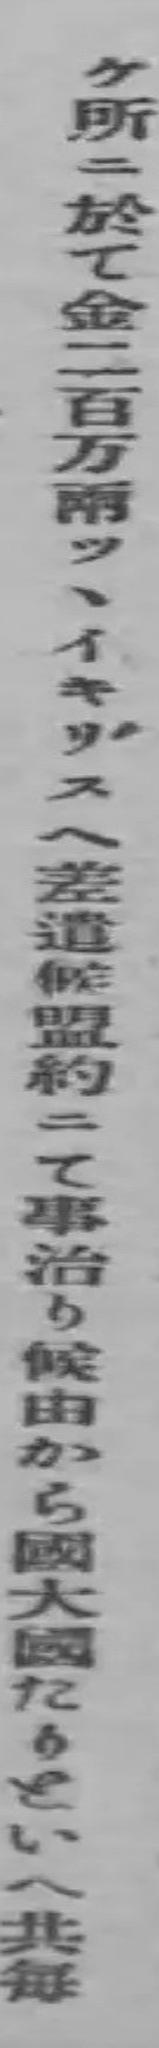ケ所ニ於て金二百万両ツヽイキリスへ差遣候盟約ニて事治り候由から国大国たりといへ共毎
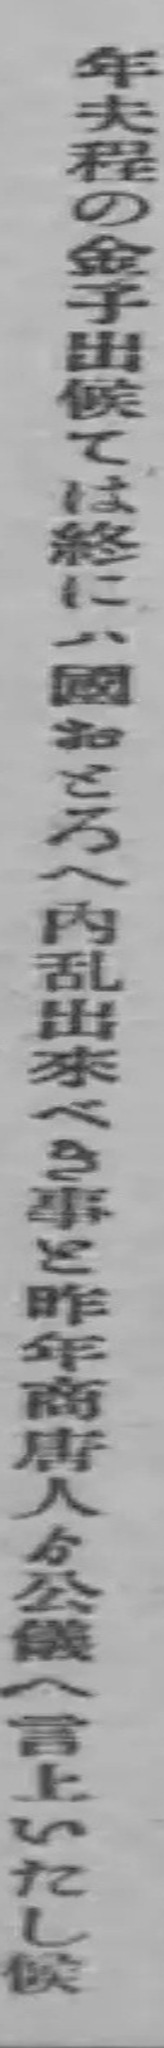年夫程の金子出候ては終にハ国おとろへ内乱出来べき事と昨年商唐人ゟ公儀へ言上いたし候
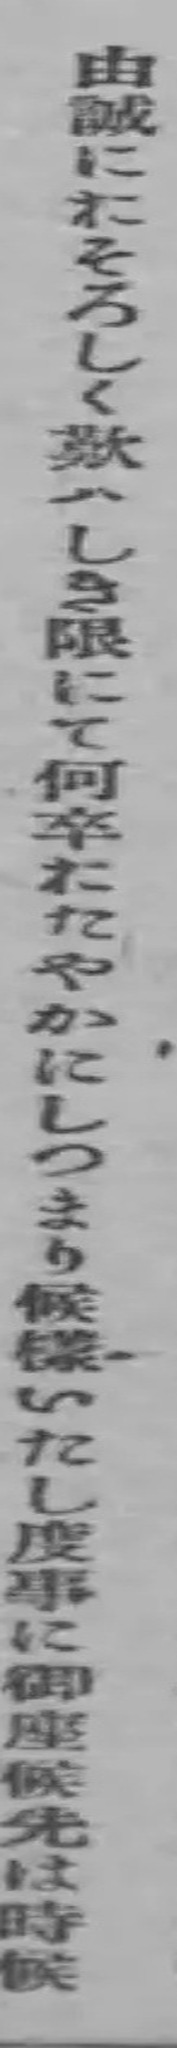由誠におそろしく歎ハしき限にて何卒おたやかにしつまり候様いたし度事に御座候先は時候
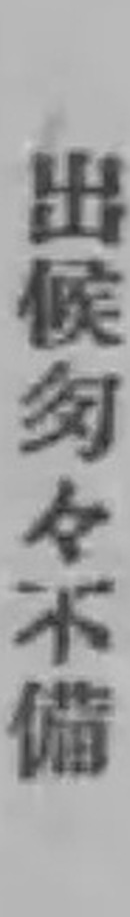出候匇々不備
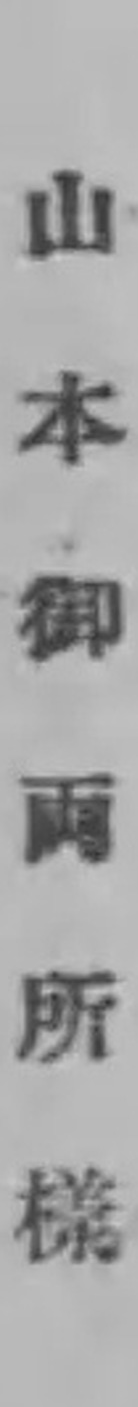山本御両所様
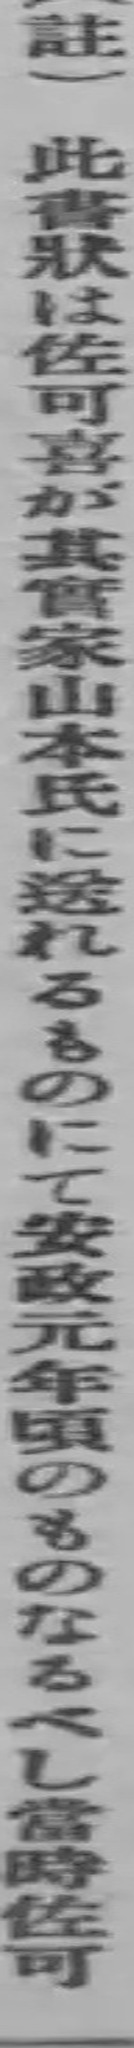(註)此書状は佐可喜が其実家山本氏に送れるものにて安政元年頃のものなるべし当時佐可
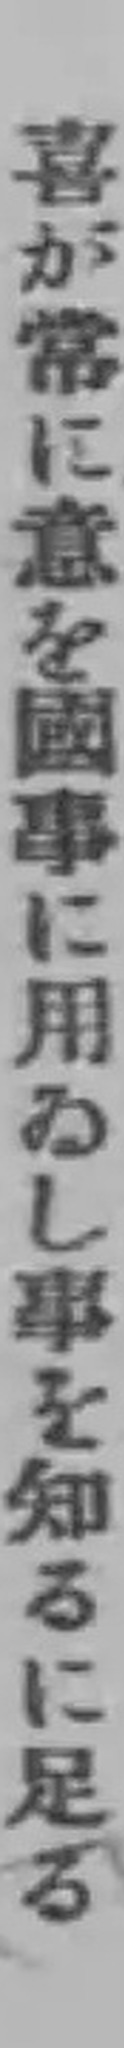喜が常に意を国事に用ゐし事を知るに足る
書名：豊橋市史談
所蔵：国立国会図書館 National Diet Library, JAPAN
